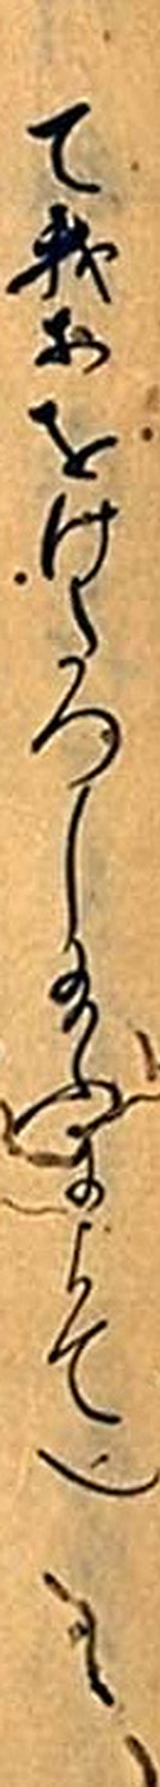て我等をけたつし給ふによて也
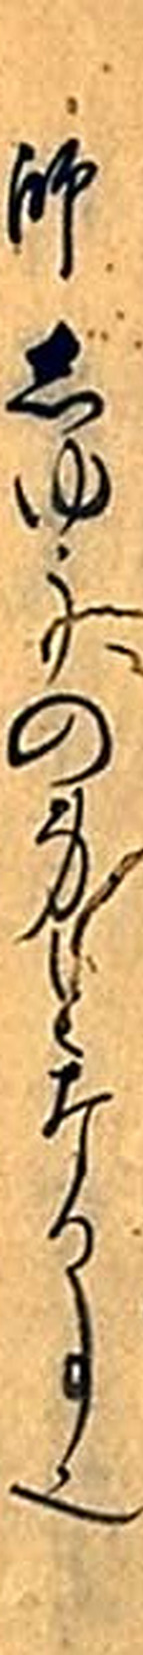師しゆうの身となる事也
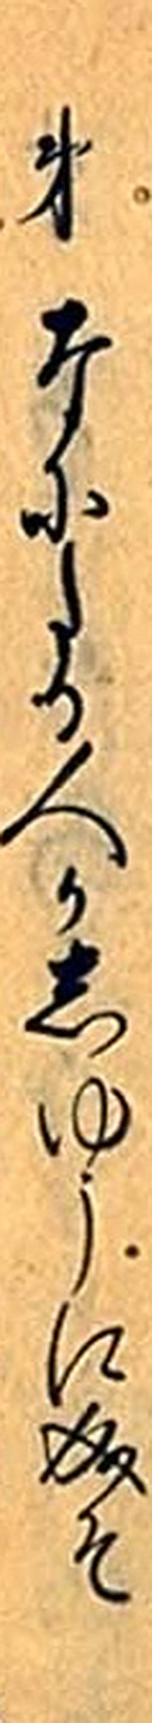弟なにたる人かしゆうにん成そ
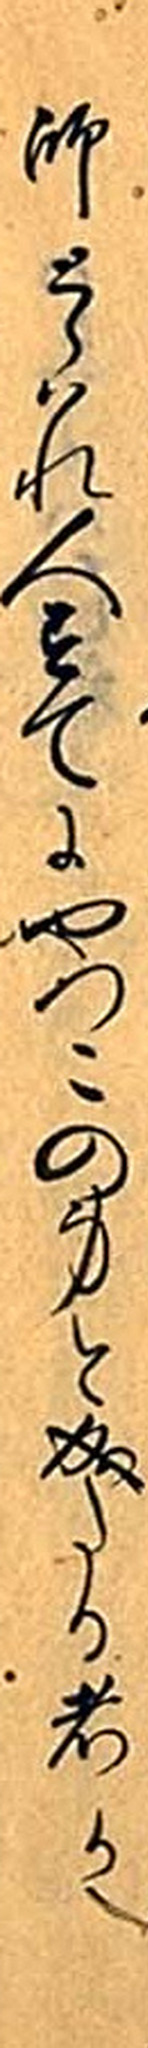師とらはれ人すてにやつこの身と成たる者か
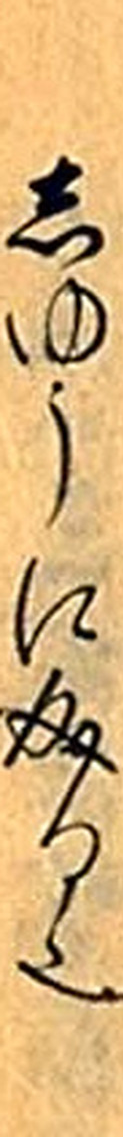しゆうに成る也
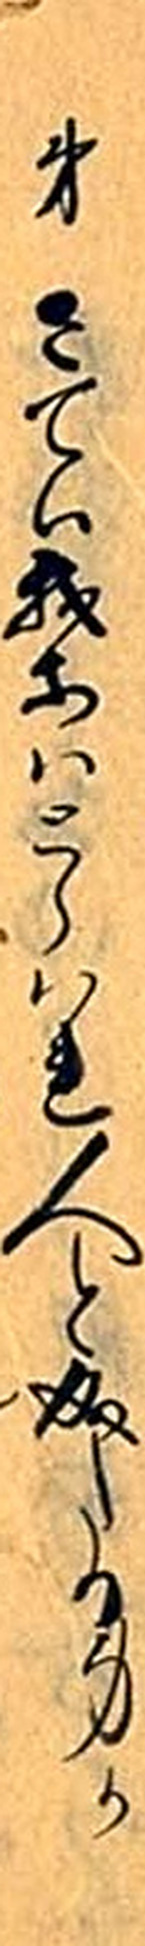弟さては我等はとらはれ人と成たる身か
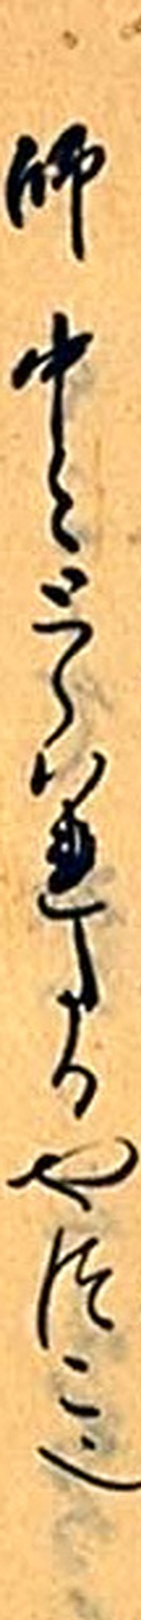師中々とらはれたるやつこ也
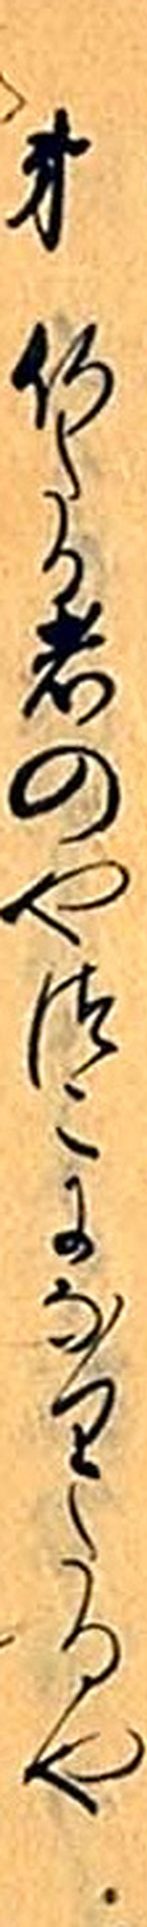弟何たる者のやつこになりたるや
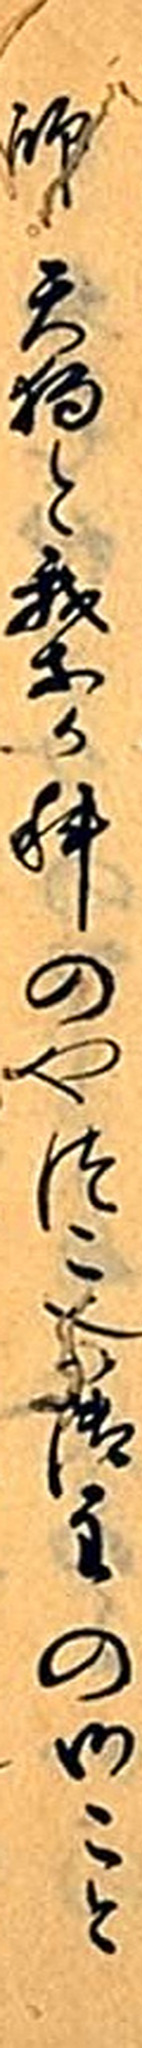師天狗と我等か科のやつこ也御主の御こと
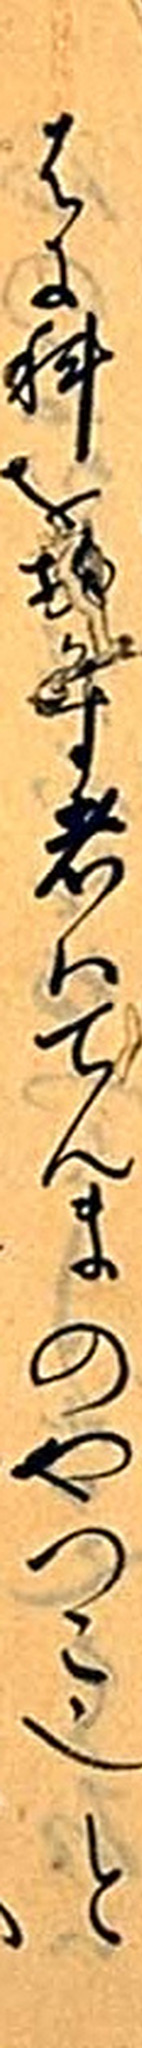はに科をおかす者はてんまのやつこ也と
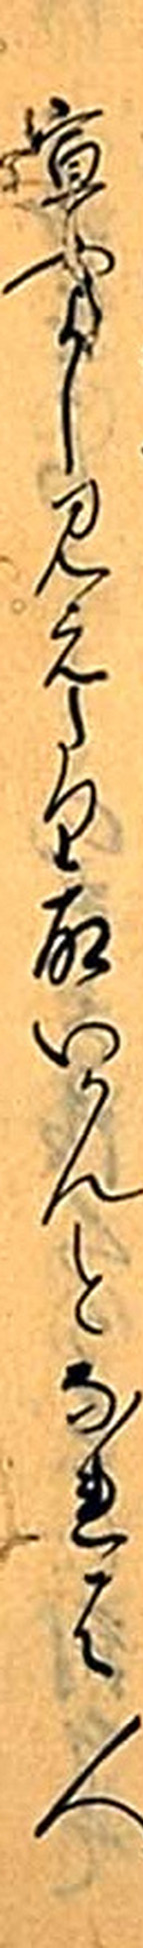宣ふよし見えたり故いかんとなれは人
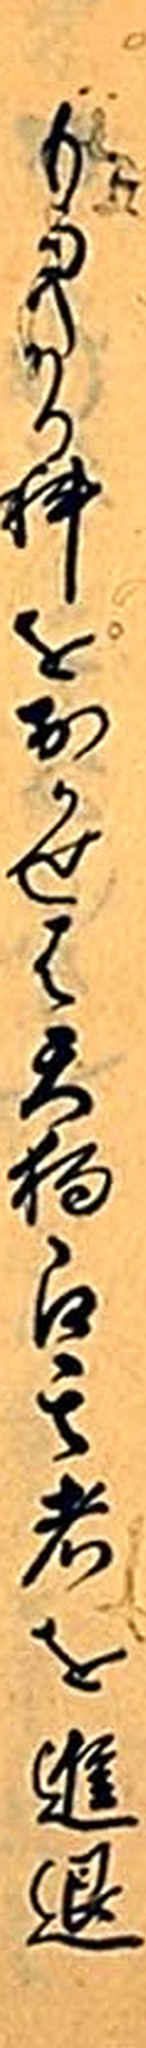もるたる科をおかせは天狗即其者を進退
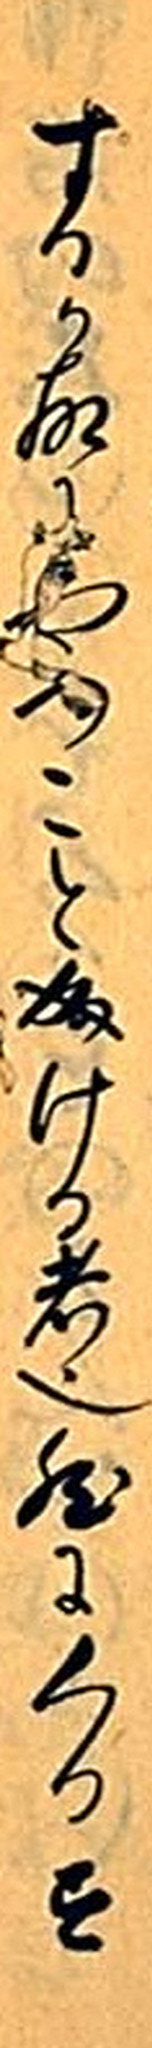するか故にやつこと成ける者也然にくるす
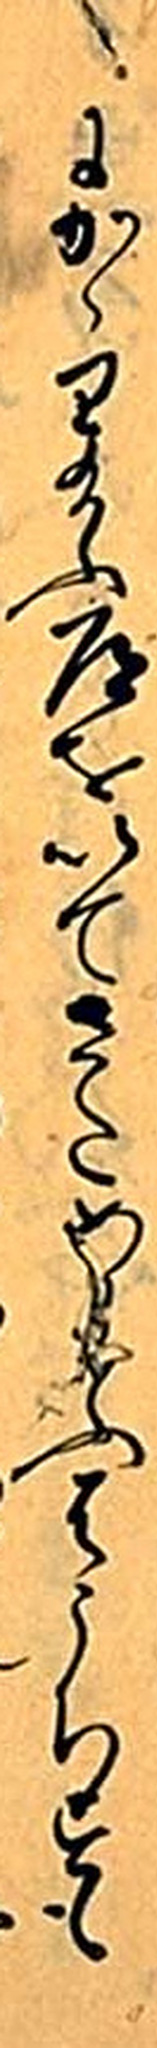にかゝり給ふ道を以てさためふはうちすも
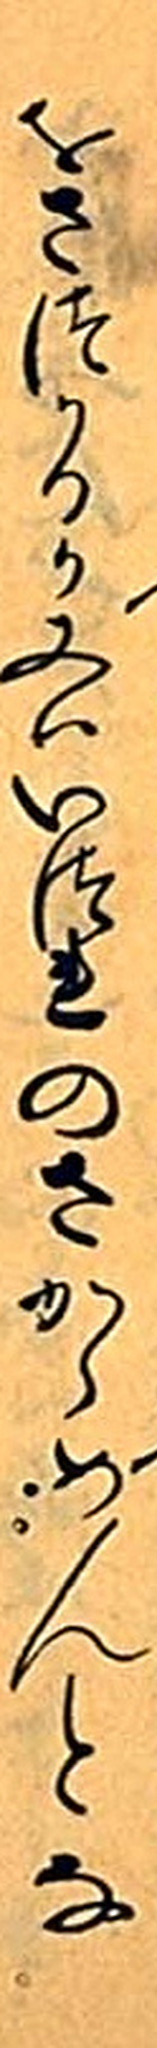をさつかるか又はいつれのさからめんとな
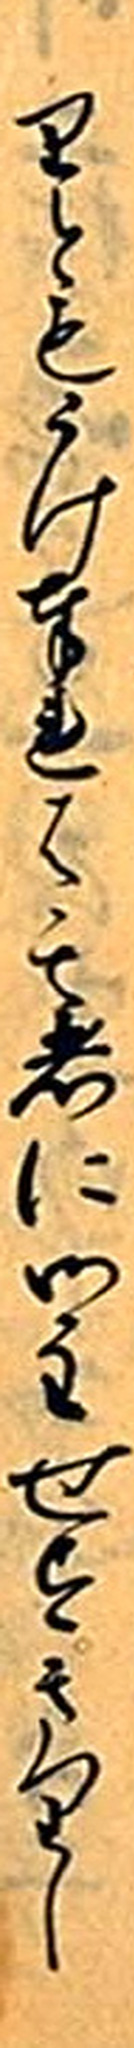りともうけ奉れは其者に御主せすきりし
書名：ドチリナ・キリシタン
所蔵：東京大学総合図書館 / General Library in the University of Tokyo
